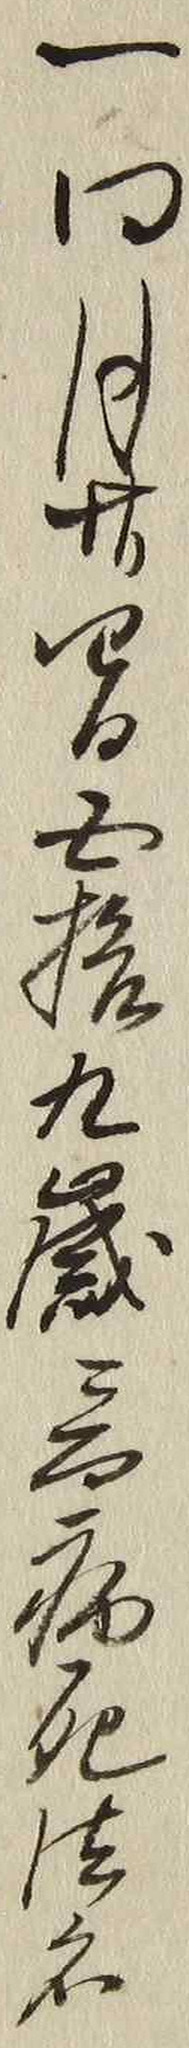一同月廿四日五拾九歳ニ而病死法名
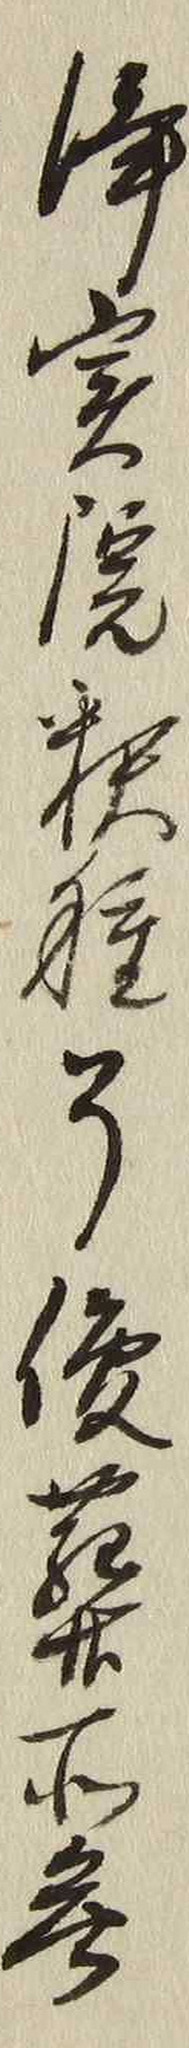浄実院釈種了俊葬所無
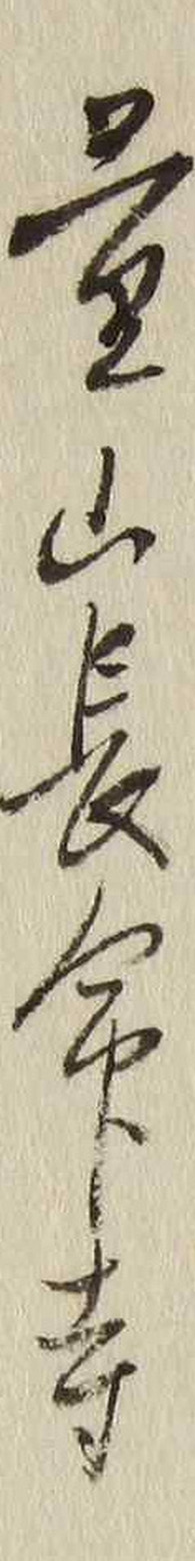量山長命寺
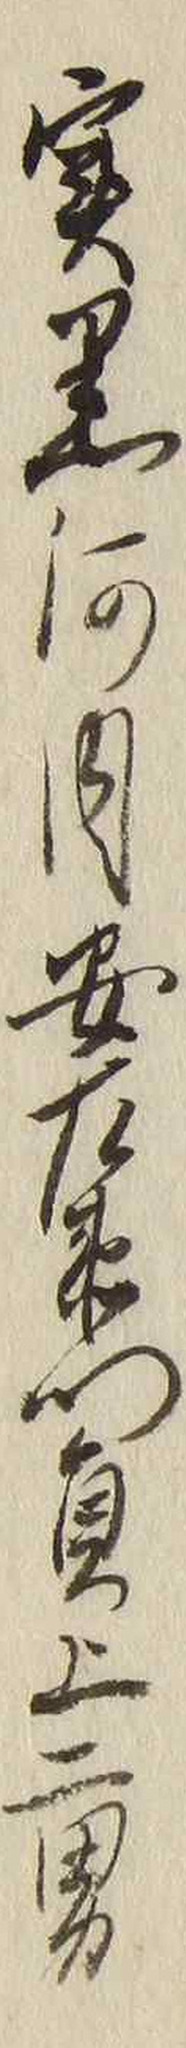実黒河内安左衛門貞上二男

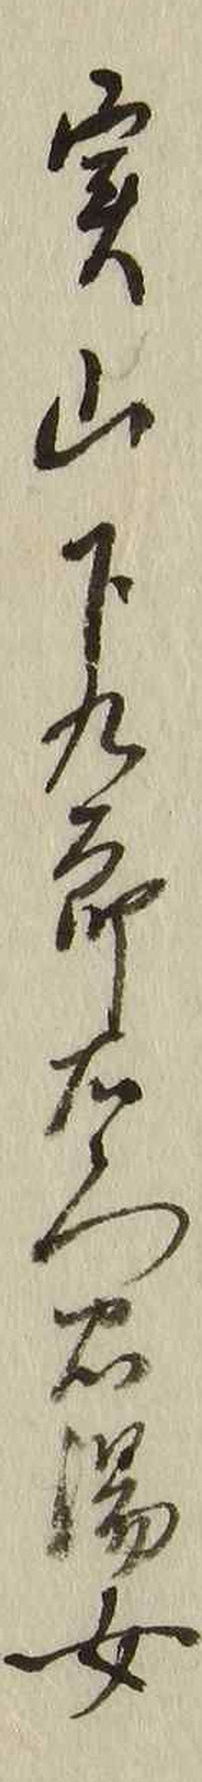実山下九郎右衛門忠湯女
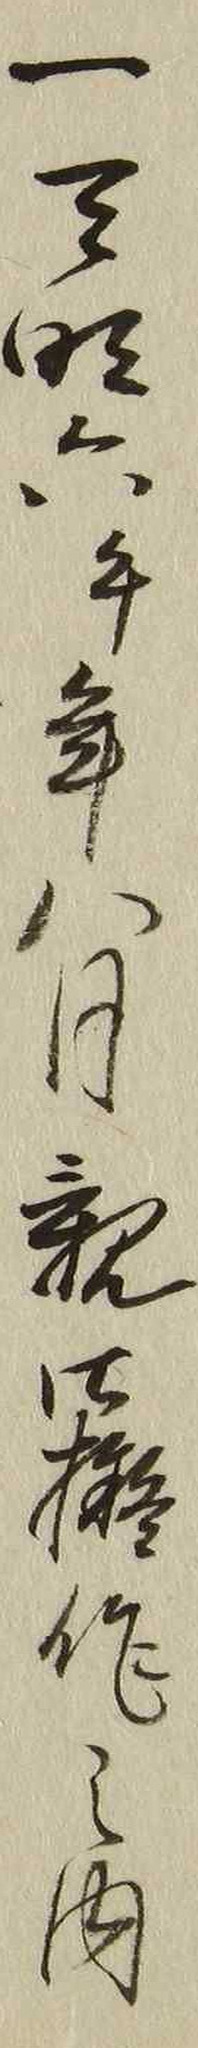一天明六午年八月親御擬作之内
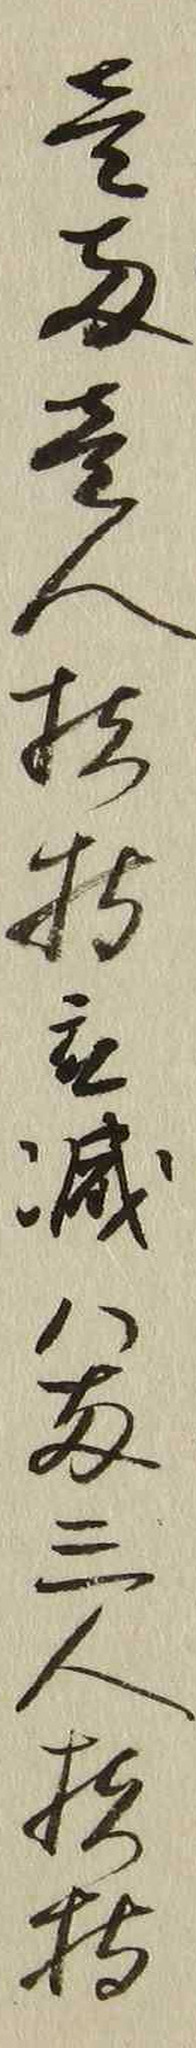壱両壱人扶持被減八両三人扶持
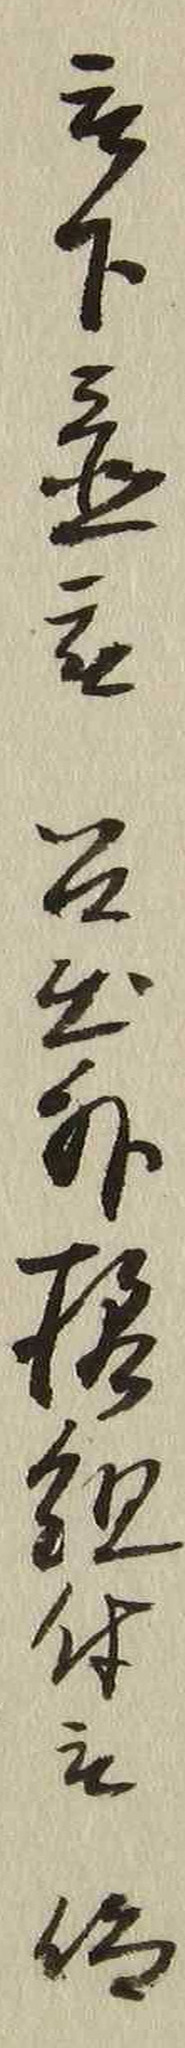被下置被召出外様組付被仰
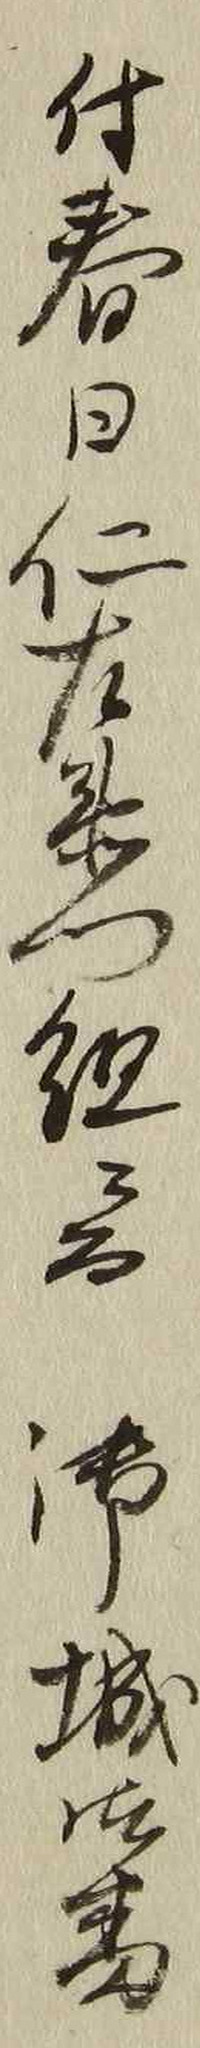付春日仁左衛門組ニ而御城御番
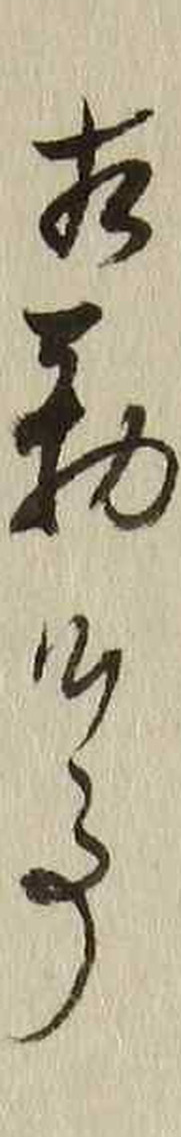相勤候事
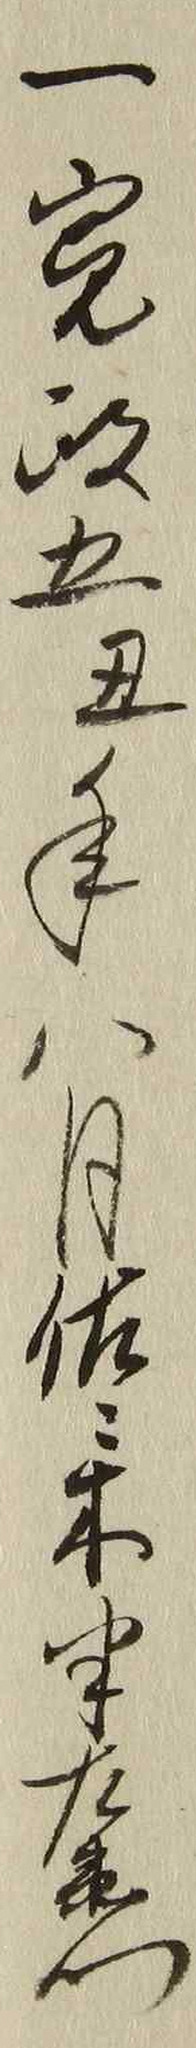一寛政五丑年八月佐々木半左衛門
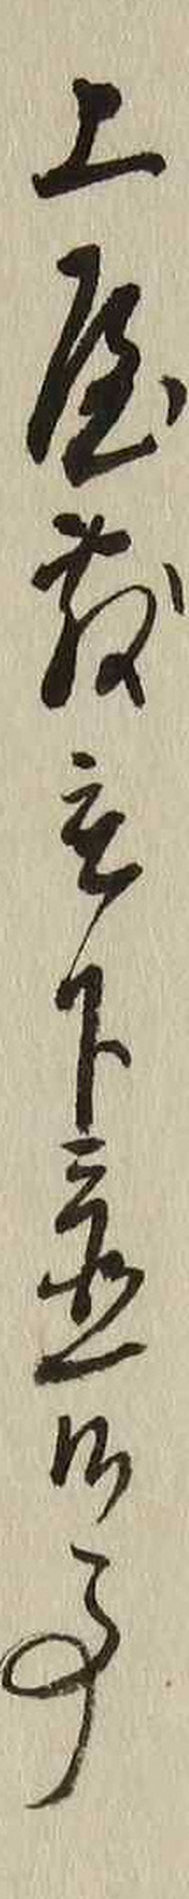上屋敷被下置候事
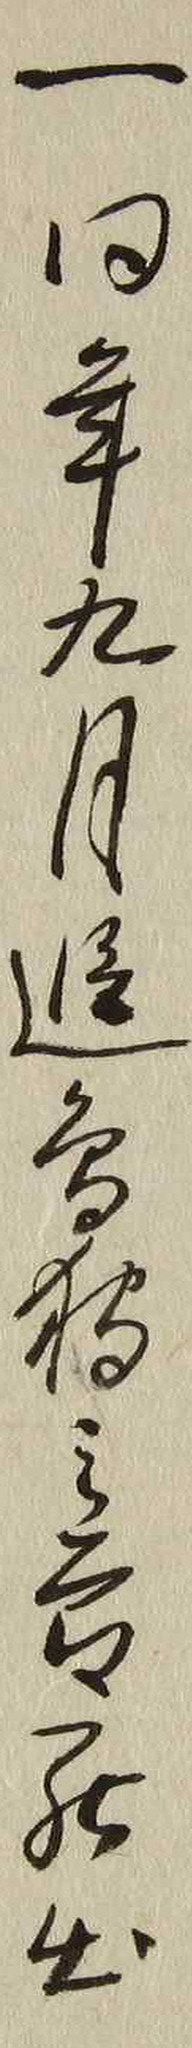一同年九月追鳥狩之節罷出
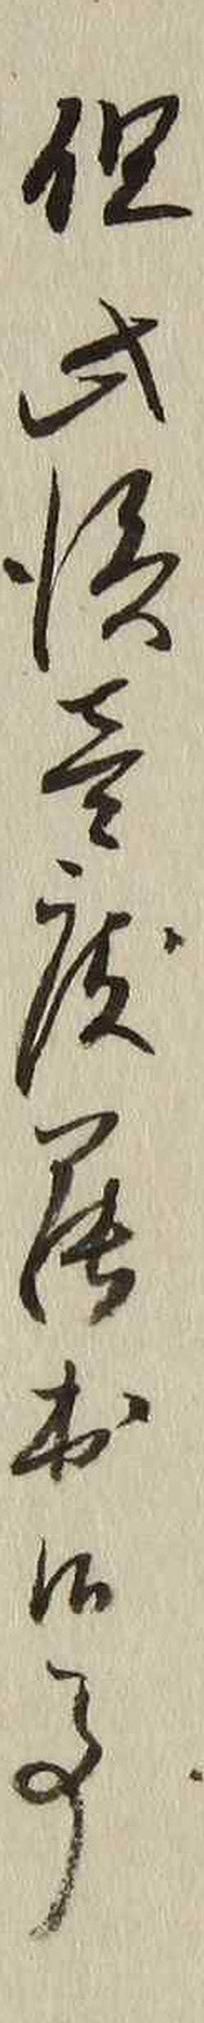但此後壱度罷出候事
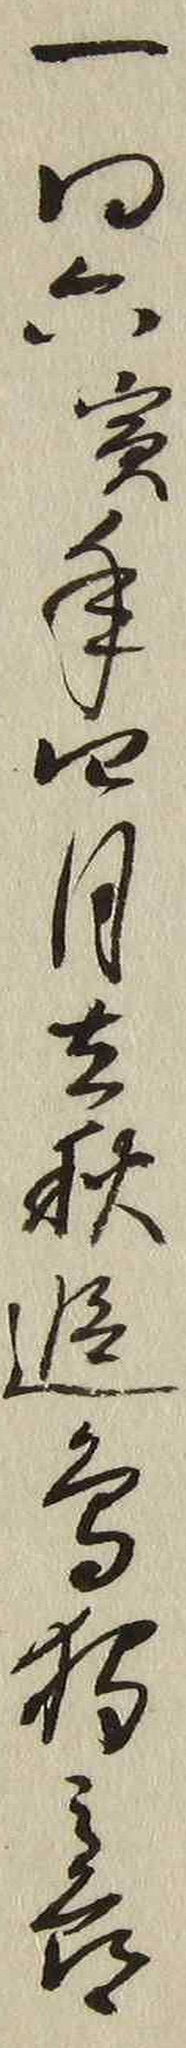一同六寅年四月去秋追鳥狩之節
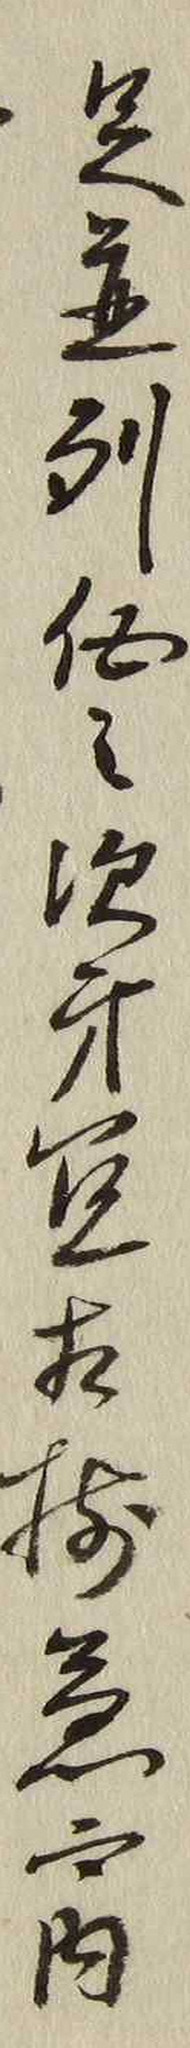足並列伍之次第宜相揃兼而内
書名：諸士系譜　巻之359　す之部9
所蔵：会津若松市立会津図書館
